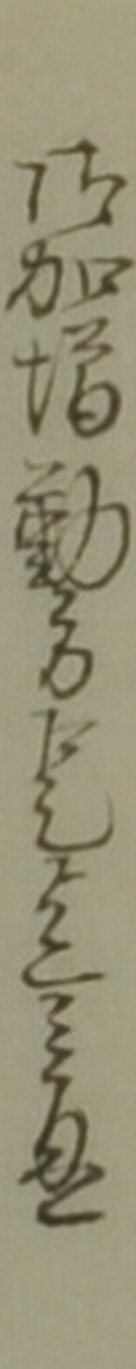御加増勤方是迄之通
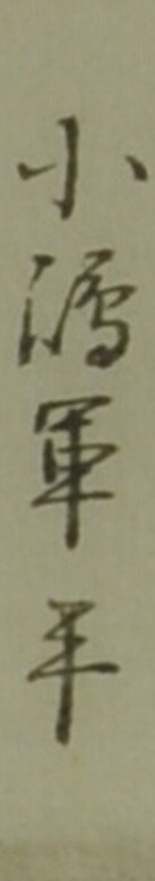小嶋軍平

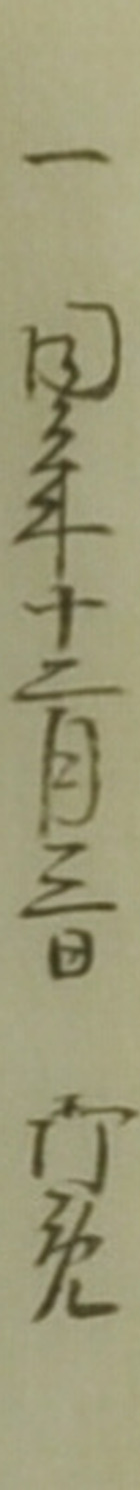一同年十二月三日御免
